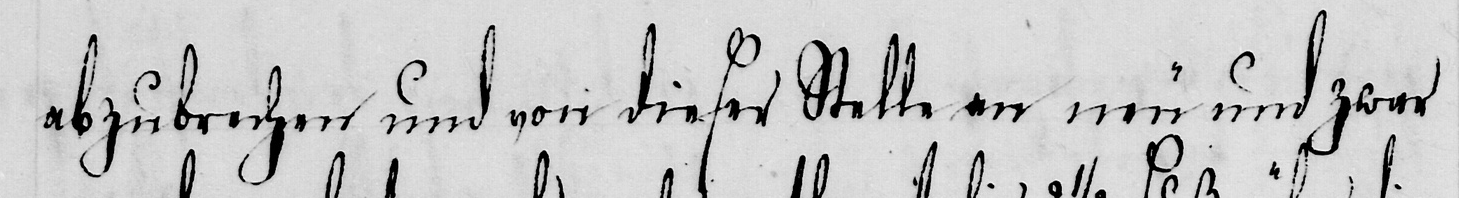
abzubrechen und von dieser Stelle an neu und zwar
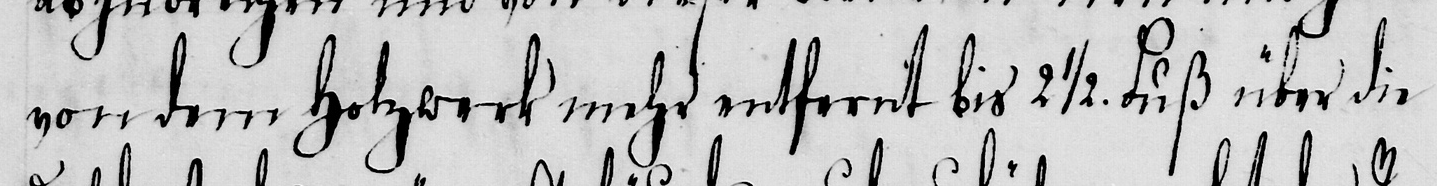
von dem Holzwerk mehr entfernt bis 21/2. Fuß über die
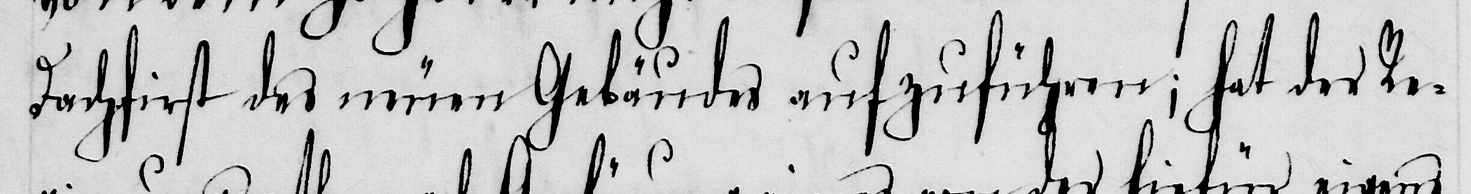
Dachfirst des neuen Gebäudes aufzuführen; hat der Re¬
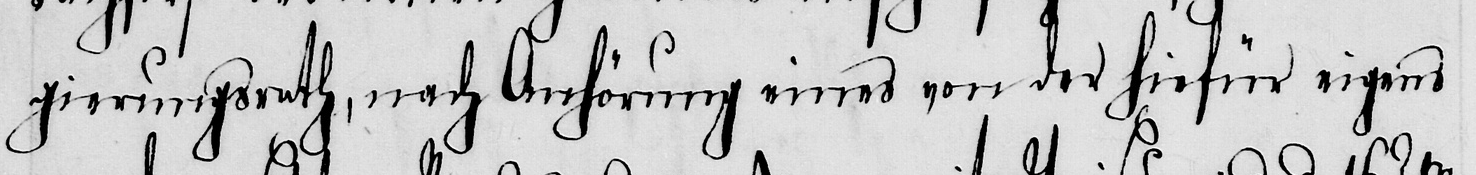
gierungsrath, nach Anhörung eines von der hiefür eigens
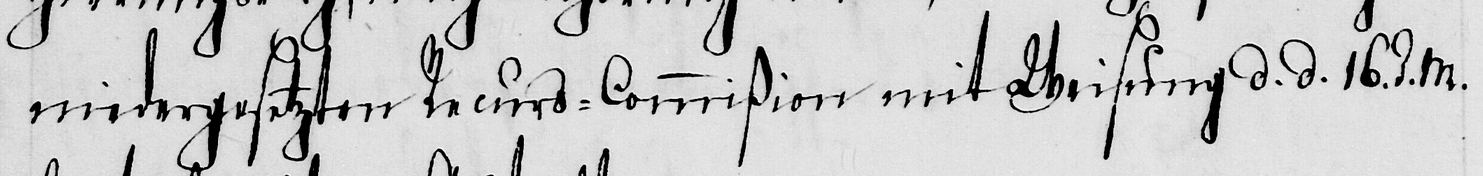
niedergesetzten Recurs-Commißion mit Weisung d. d. 16. d.
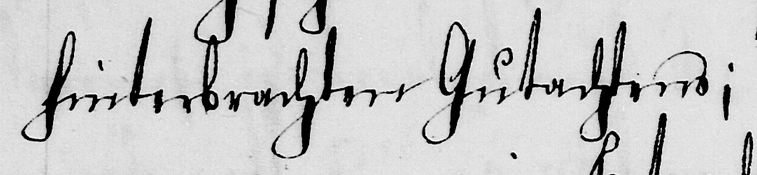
hinterbrachten Gutachtens;
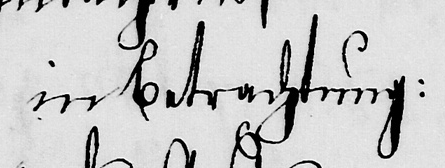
in Betrachtung:
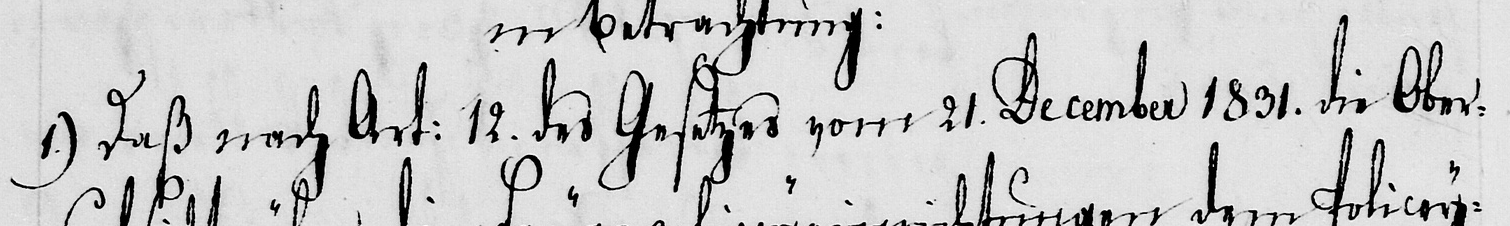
1.) Daß nach Art: 12. des Gesetzes vom 21. December 1831. die Ober¬
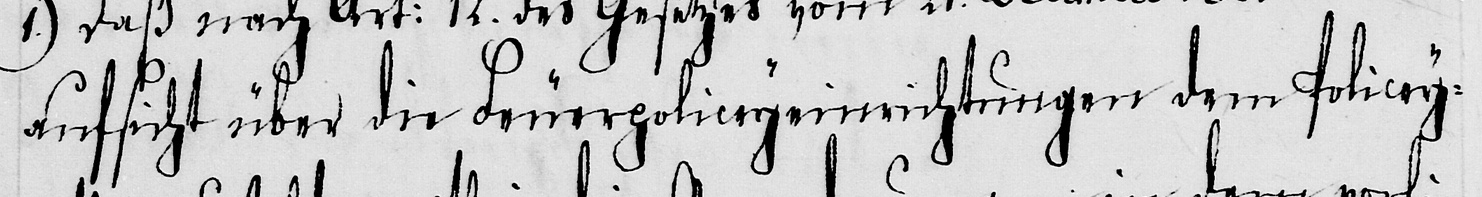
aufsicht über die Feuerpoliceyeinrichtungen dem Policey¬
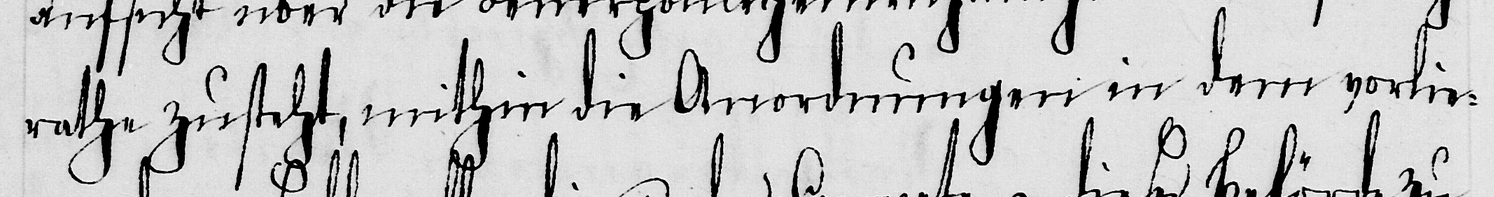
rathe zusteht, mithin die Anordnungen in dem vorlie¬
